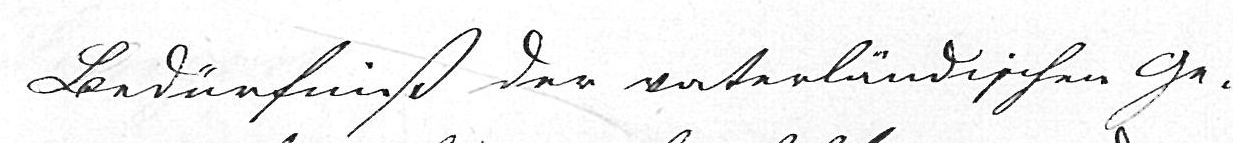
Bedürfniß der vaterländischen Ge
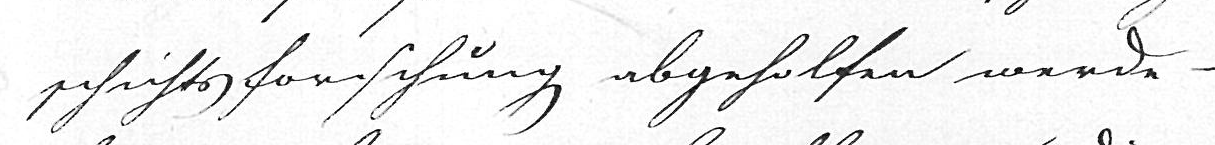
schichtsforschung abgeholfen werde -
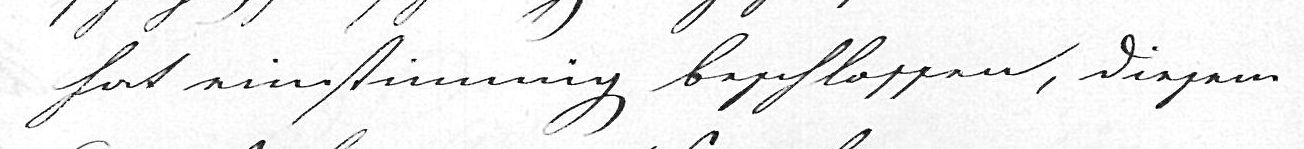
hat einstimmig beschlossen, diesem
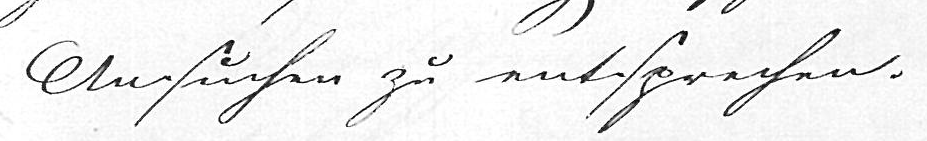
Ansuchen zu entsprechen.
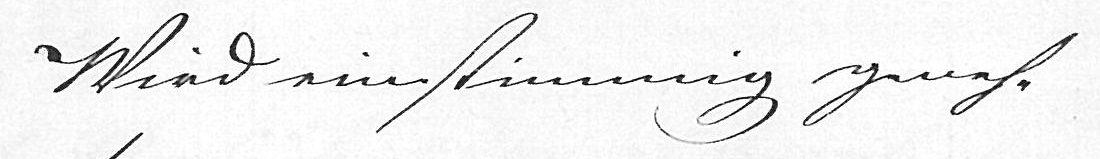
Wird einstimmig geneh-
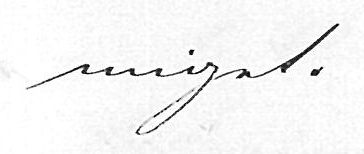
miget.
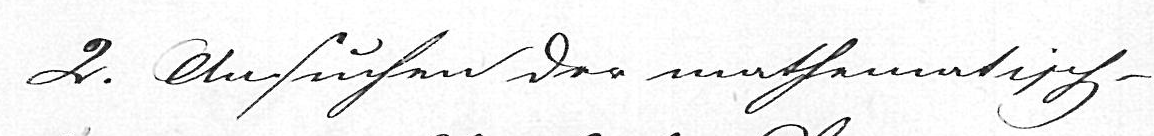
2. Ansuchen der mathematisch-
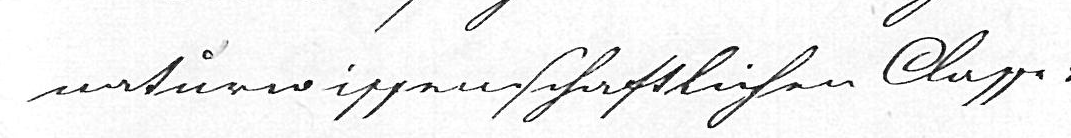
naturwissenschaftlichen Classe:
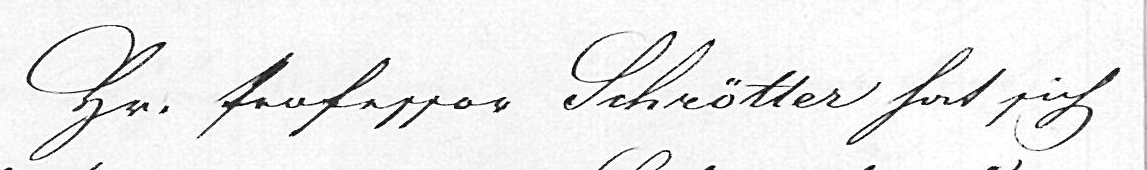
Hr. Professor Schrötter hat sich
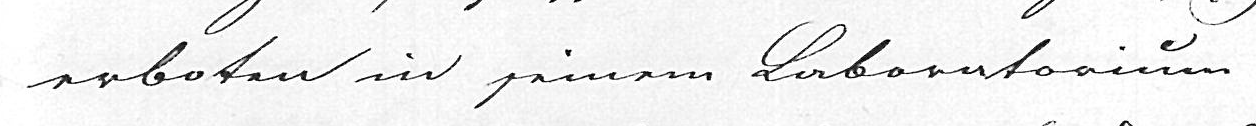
erbeten in seinem Laboratorium
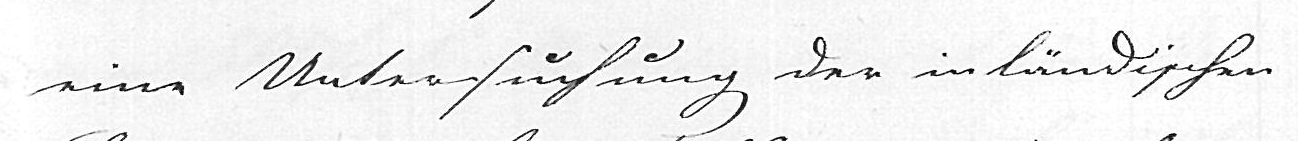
eine Untersuchung der inländischen
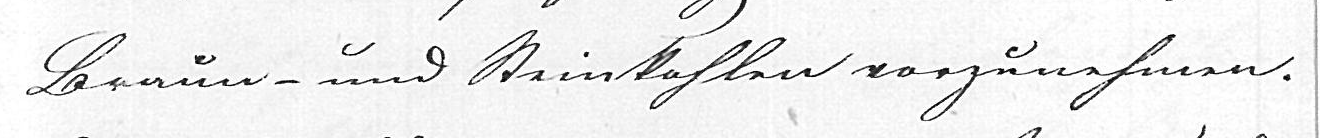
Braun- und Steinkohlen vorzunehmen.
